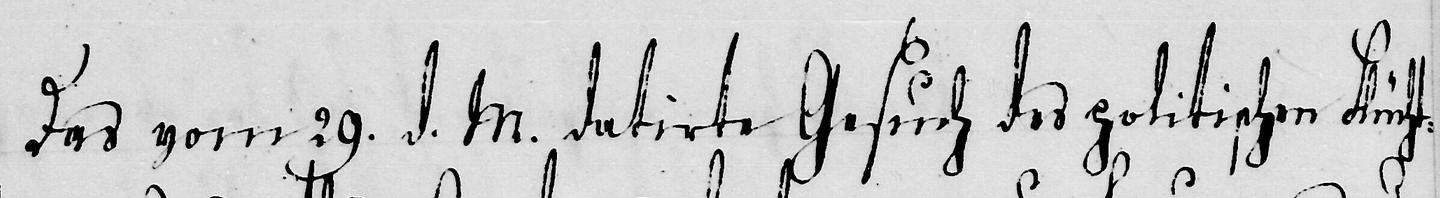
Das vom 29. d. M. datirte Gesuch des politischen Fl¬
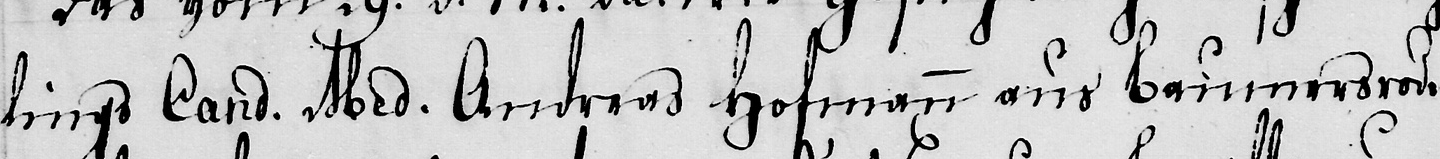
lings Cand. Med. Andreas Hofmann aus Baumersrode
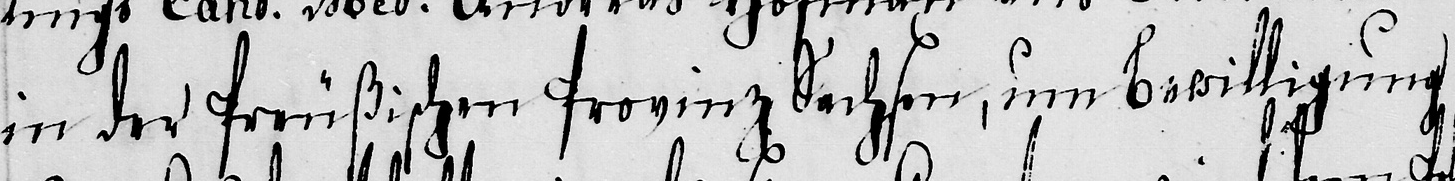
in der Preußischen Provinz Sachsen, um Bewilligung
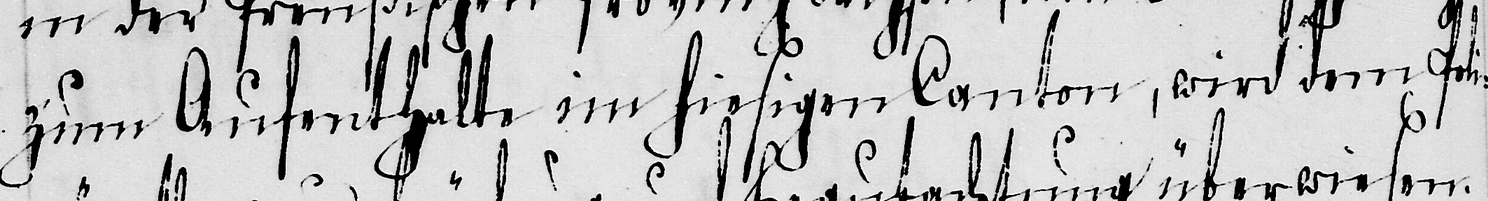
zum Aufenthalte in hiesigen Canton, wird dem Pol¬
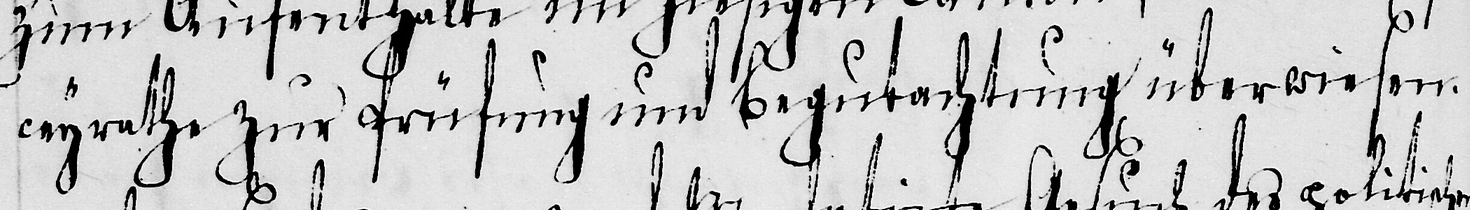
iceyrathe zur Prüfung und Begutachtung überwiesen.
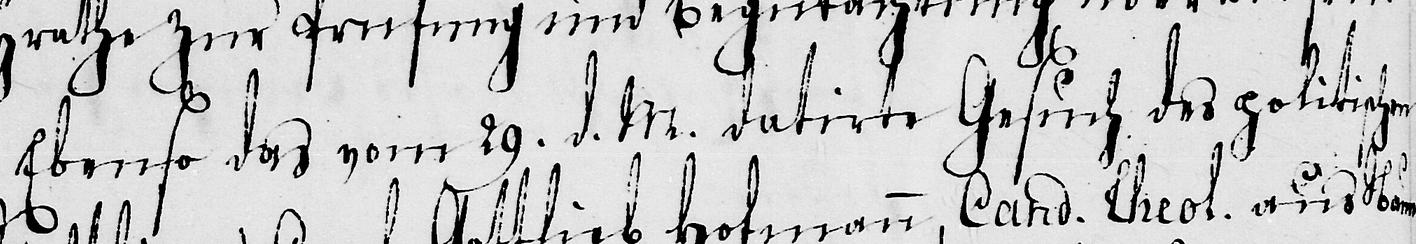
Ebenso das vom 29. d. M. datirte Gesuch des politisch¬
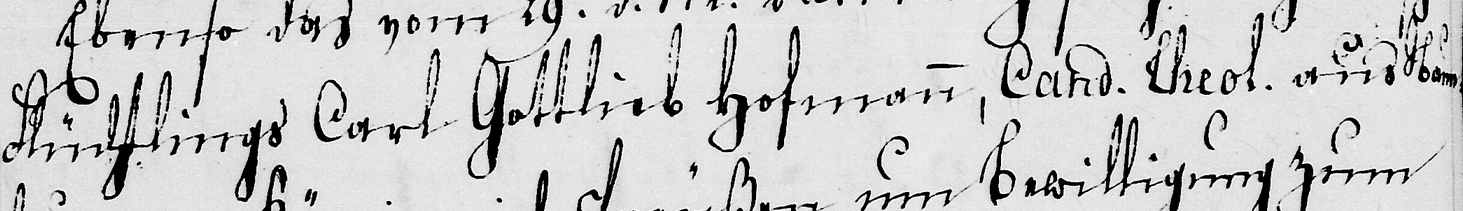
Flüchtlings Carl Gottlieb Hofmann, Cand. theol. aus Nau¬
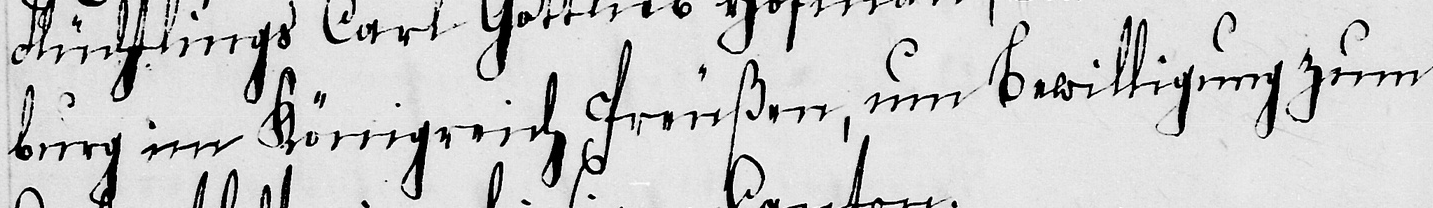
burg im Königreich Preußen, um Bewilligung zum
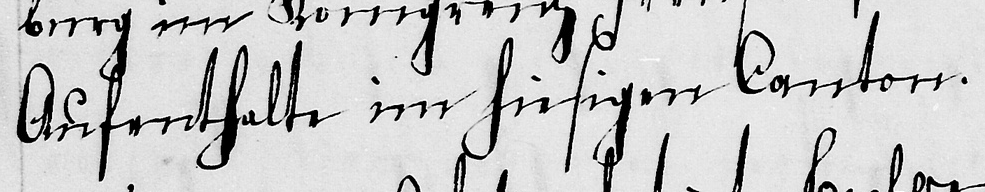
Aufenthalte im hiesigen Canton.
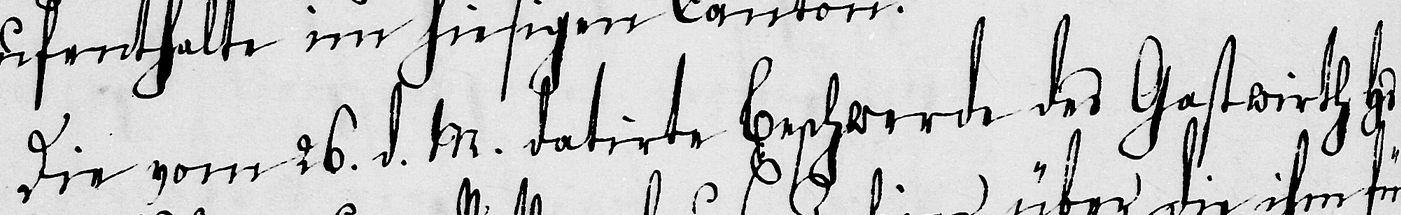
Die vom 26. d. M. datirte Beschwerde des Gastwirth
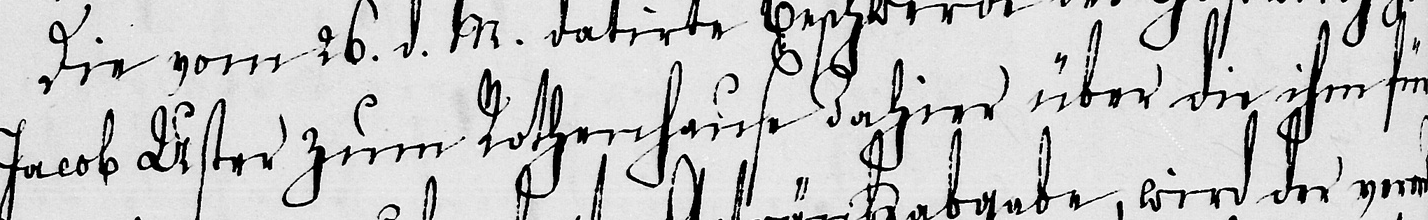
Jacob Uster zum Rothenhause dahier über die ihm für
